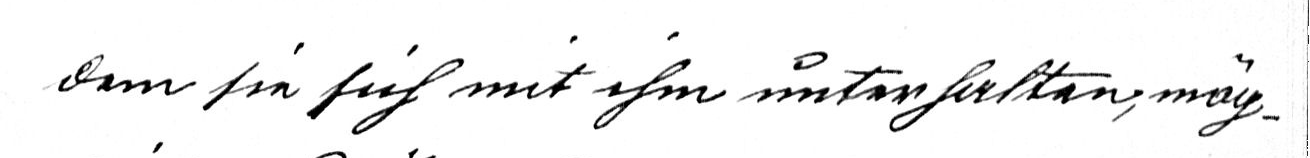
dem sie sich mit ihm unterhalten, mög¬
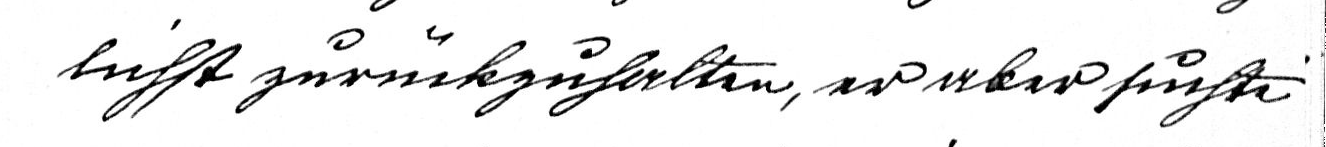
licht zurückzuhalten, er aber suchte
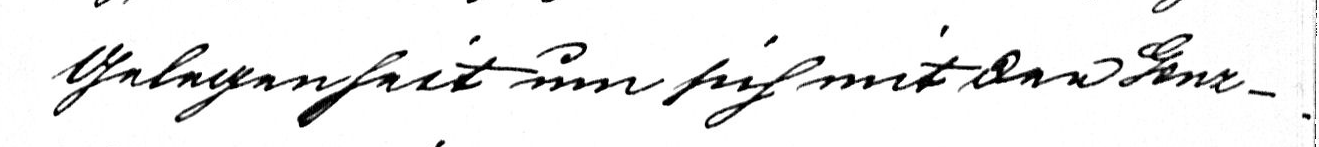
Gelegenheit um sich mit den Genz¬
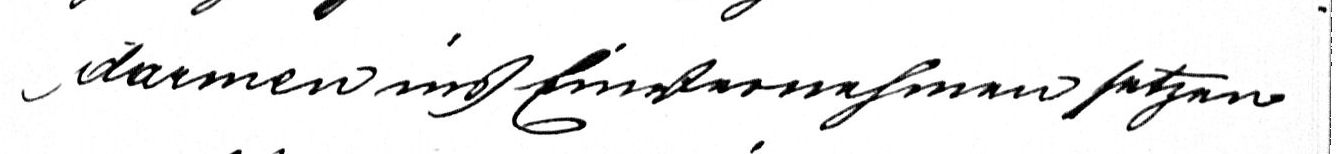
darmen ins Einvernehmen setzen
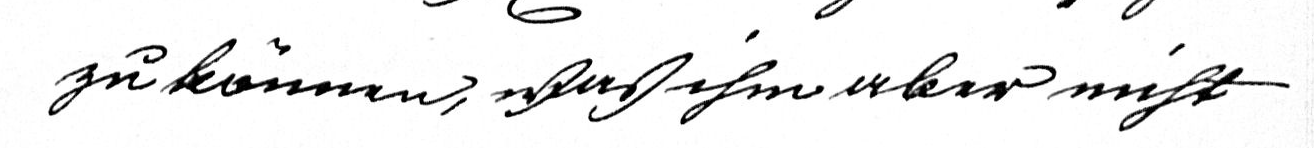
zu können, was ihm aber nicht
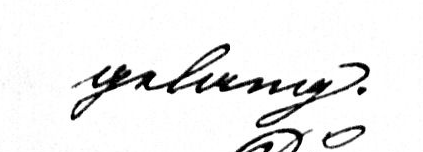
gelang.
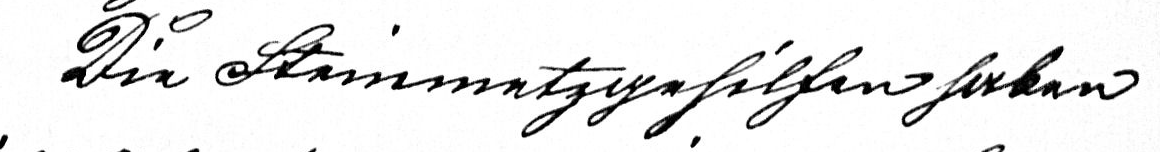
Die Steinmetzgehilfen haben
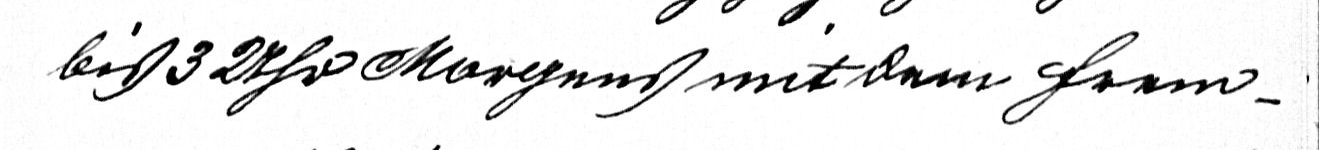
bis 3 Uhr Morgens mit dem frem¬
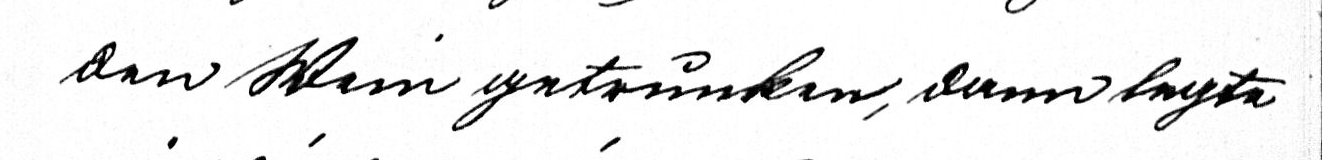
den Wein getrunken, dann legte
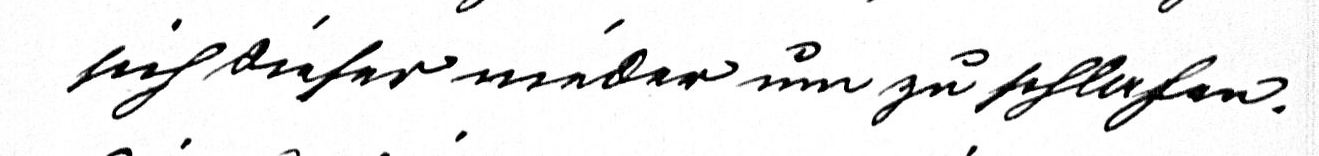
sich dieser nieder um zu schlafen.
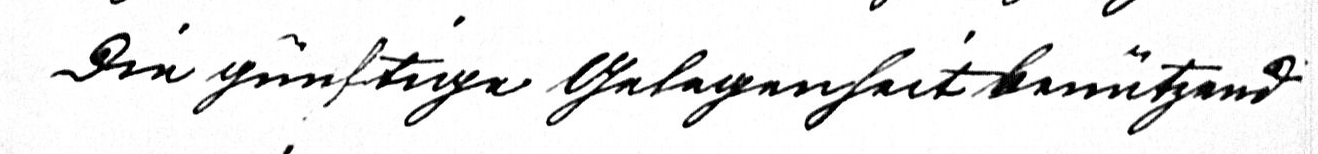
Die günstige Gelegenheitbenützend
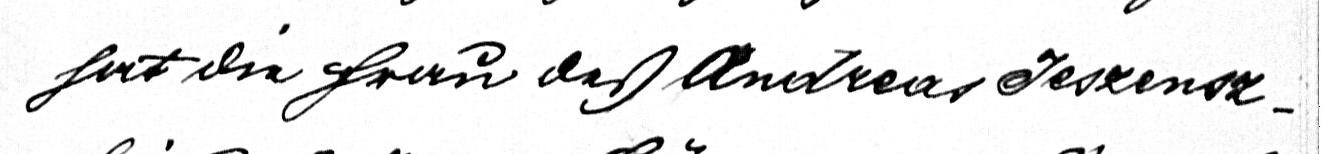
hat die Frau des Andreas Jeszensz¬
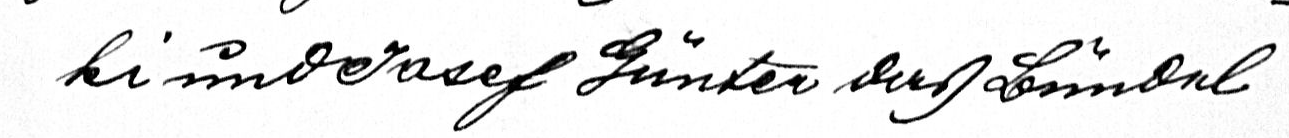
ki und Josef Günter das Bündel
